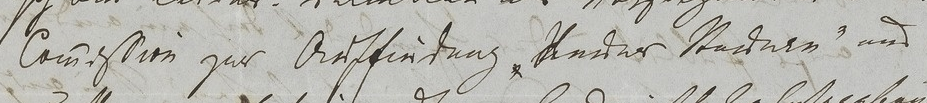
Commission zur Auffindung «Neuer Steuern» und
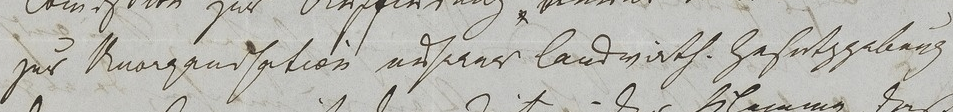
zur Reorganisation unserer landwirth. Gesetzgebung
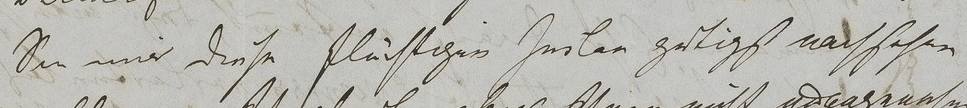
Sie mir diese flüchtigen Zeilen gütigst nachsehen
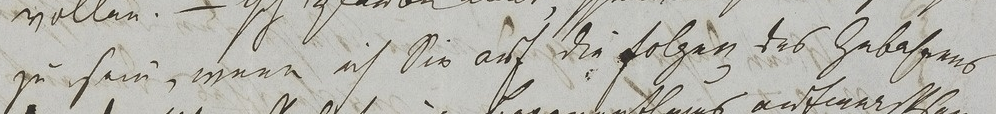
zu sein, wenn ich Sie auf die Folgen des Gebahrens
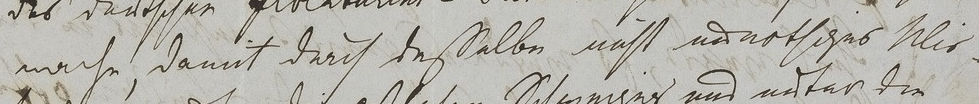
mache, damit durch dasselbe nicht unnöthiges Mis-
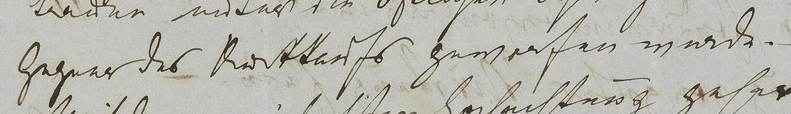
Gegner des Rückkaufs geworfen werde. –
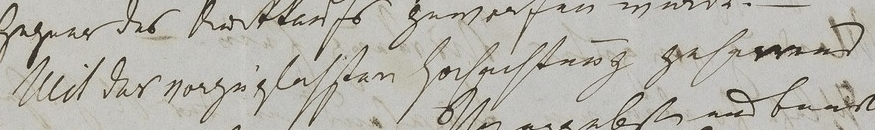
Mit der vorzüglichsten Hochachtung geharrend
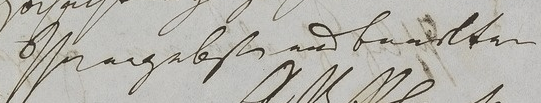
Ihr ergebster und beeilter
